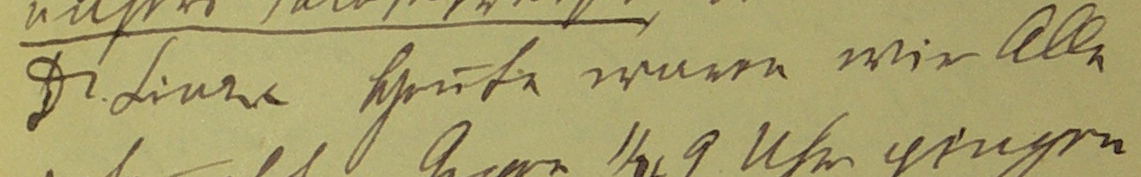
bei Dr. Linzer. Heute waren wir Alle
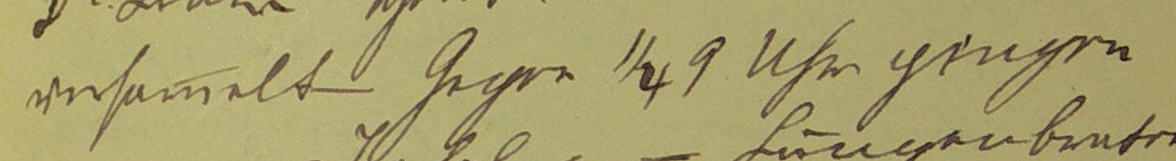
versamelt - Gegen ¼ 9 gingen
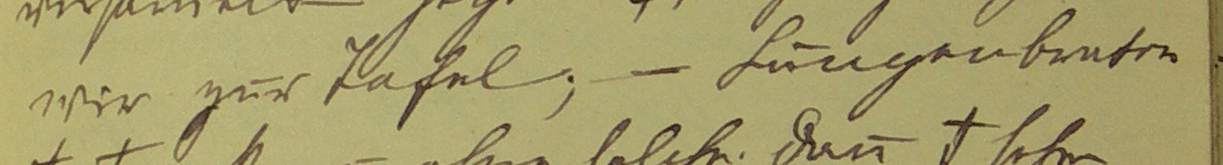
wir zur Tafel; - Lungenbraten
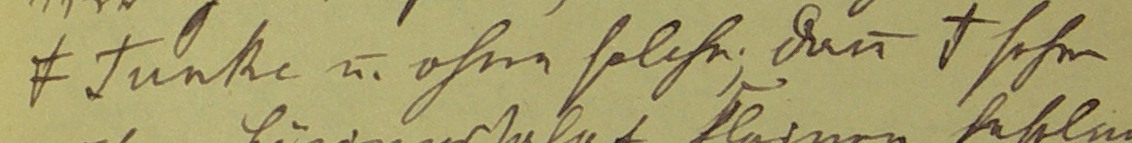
mit Tunke u. ohne solche, - dan mit sehr
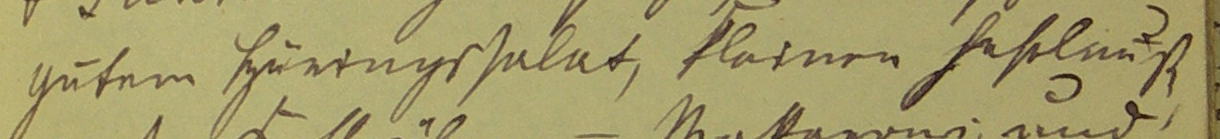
gutem Heringssalat, kleinen haselnuss¬
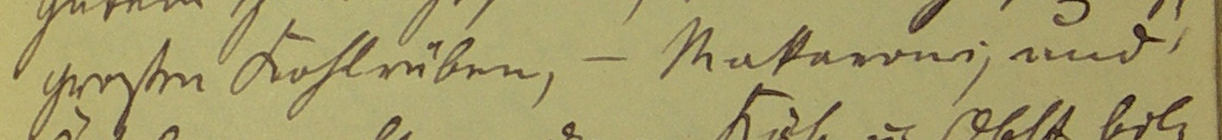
großen Kohlrüben, - Makaroni, und
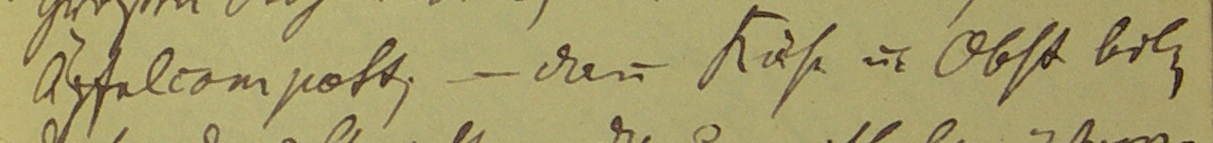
Äpfelcompott; - dann Käse und Obst been¬
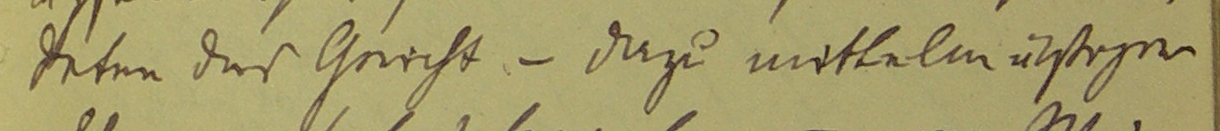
deten das Gericht, - dazu mittelmäßigen alten
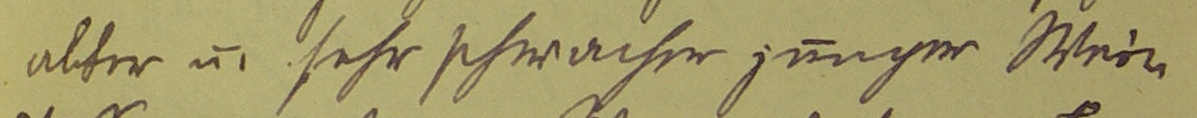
und sehr schwachen jungen Wein
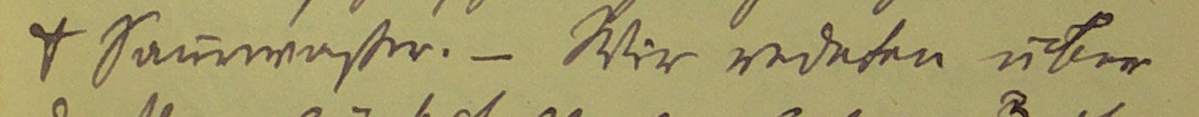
mit Sauerwasser.- Wir redeten über
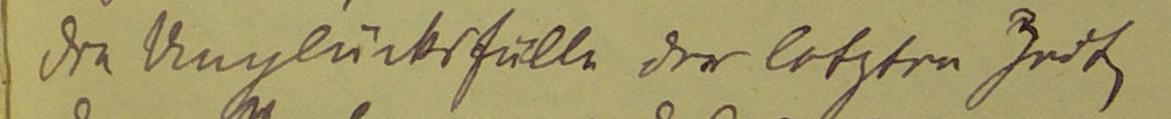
die Unglücksfülle der letzten Zeit,
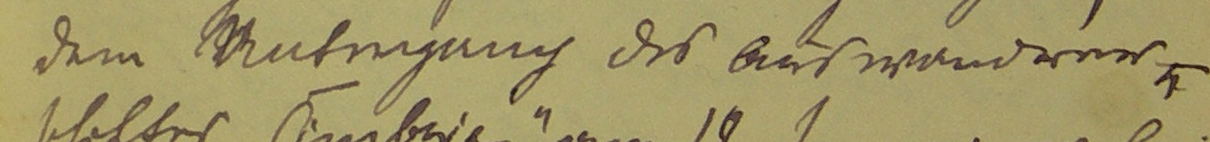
dem Untergang des Auswanderer¬
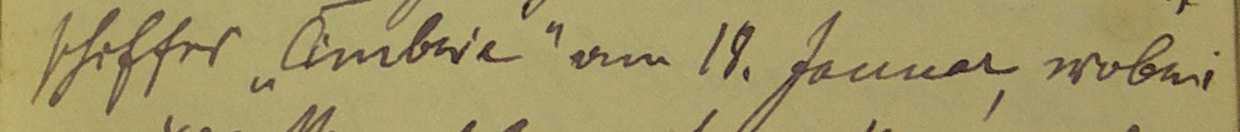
schiffes ??? vom 18. Januar, wobei
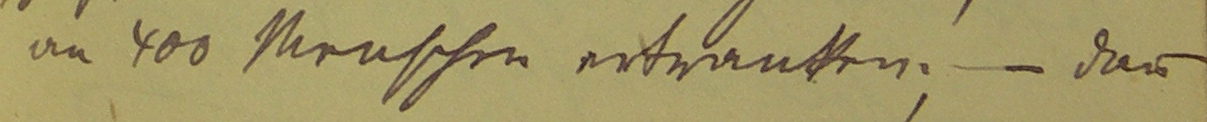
an 400 Menschen ertranken; - dan
